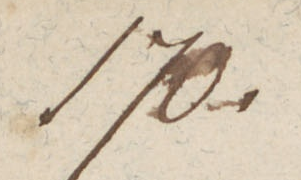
170.
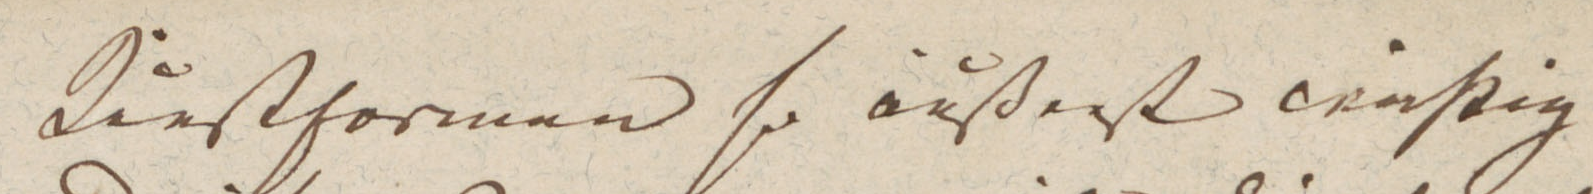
Kunstformen so äusserst wichtig
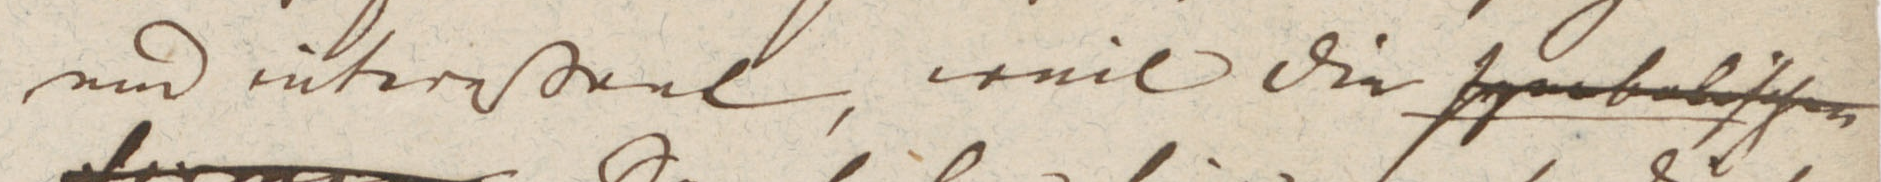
und interessant, weil die symbolischen
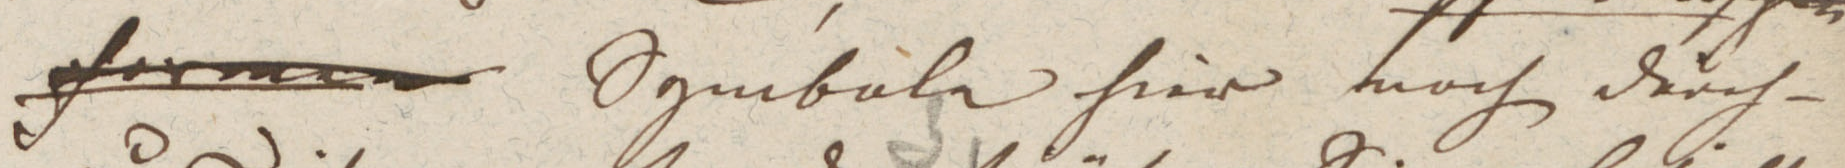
Formen Symbole hier noch durch-
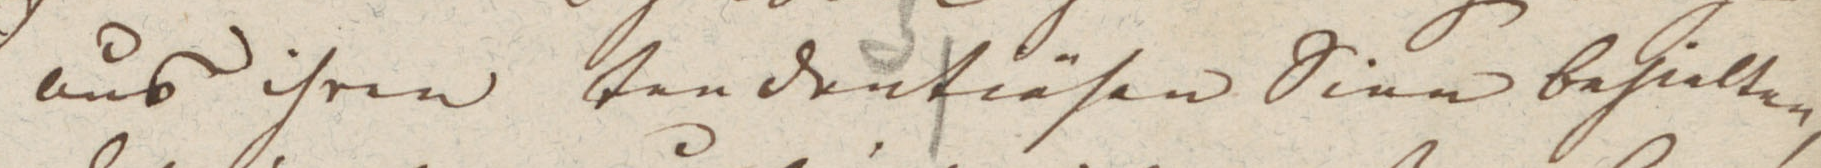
aus ihren tendentziösen Sinn behielten,
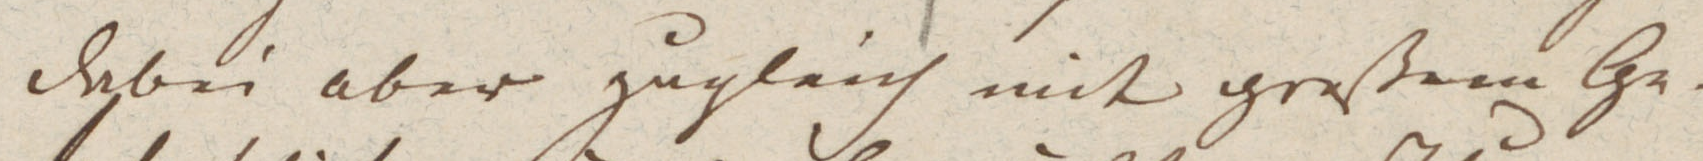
dabei aber zugleich mit grossem Ge-
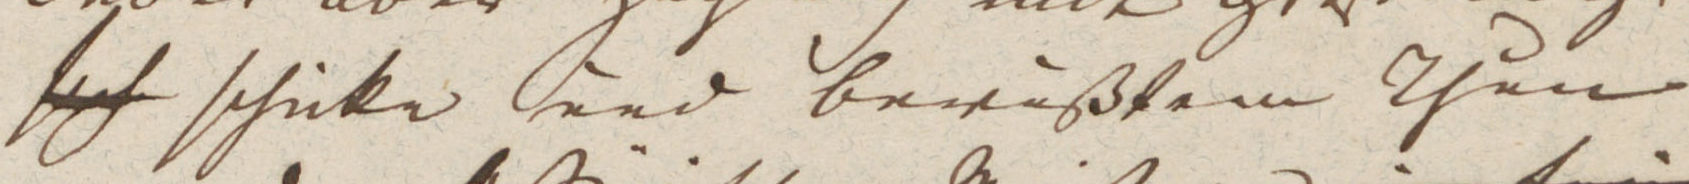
sich schicke und bewusstem Thun
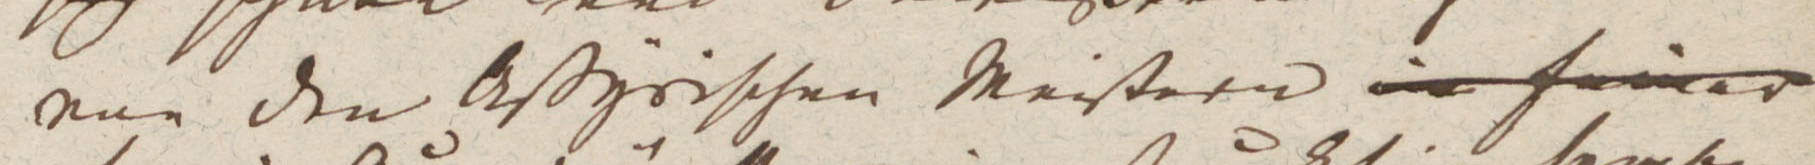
von den Assyrischen Meistern in seiner
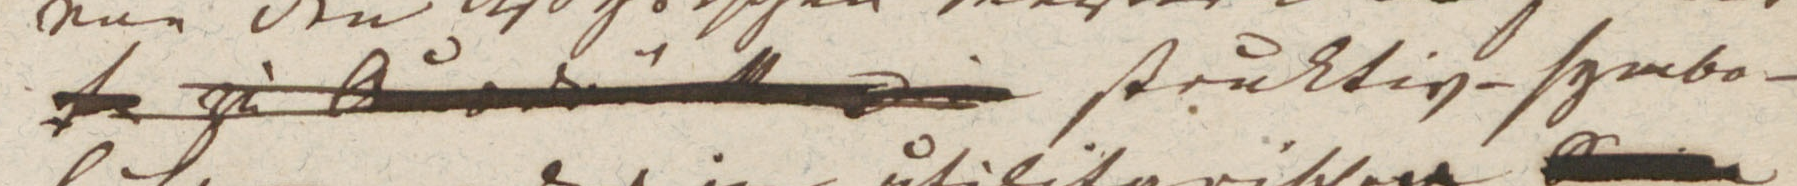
te zu Ausdrücken in struktiv-symbo-
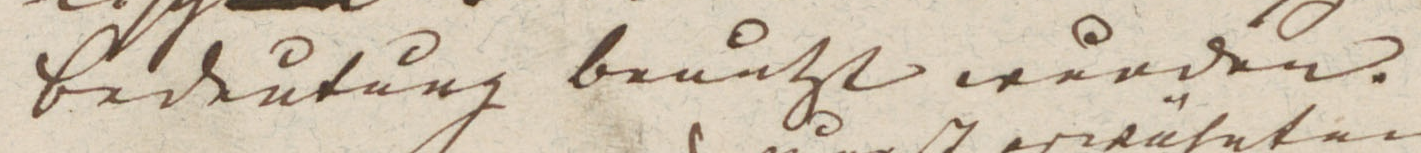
Bedeutung benutzt wurden.
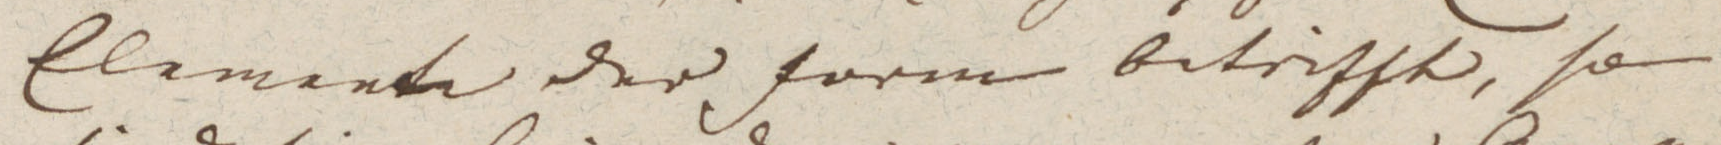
Elemente der Form betrifft, so
